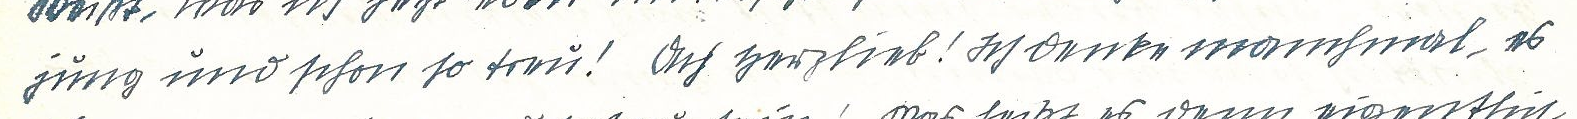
jung und schon so treu! Ach Herzlieb! Ich denke manchmal, es
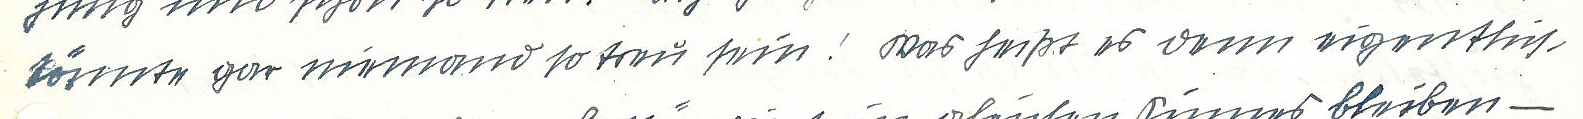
könnte gar niemand so treu sein! Was heißt es denn eigentlich,
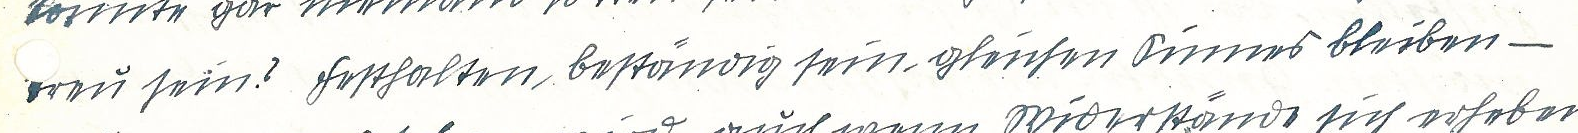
treu sein? Festhalten, beständig sein, gleichen Sinnes bleiben –
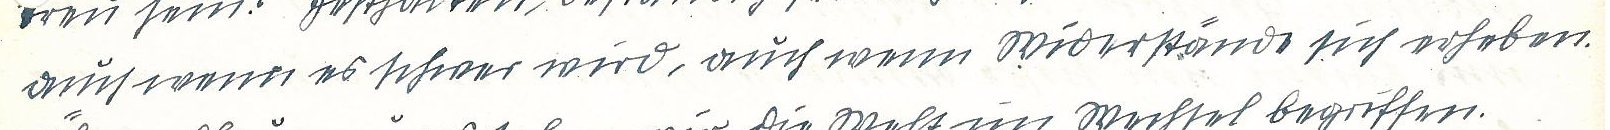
auch wenn es schwer wird, auch wenn Widerstände sich erheben.
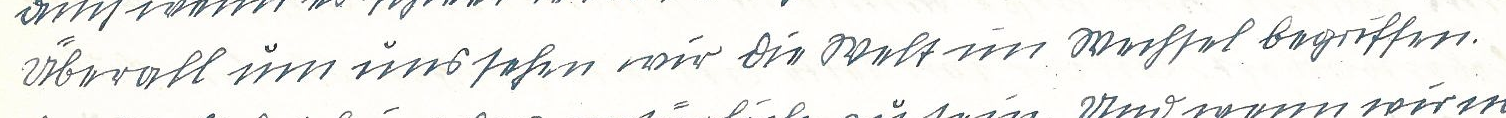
Überall um uns sehen wir die Welt im Wechsel begriffen.
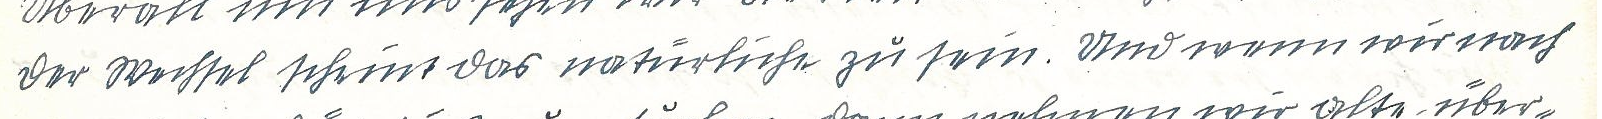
Der Wechsel scheint das natürliche zu sein. Und wenn wir nach
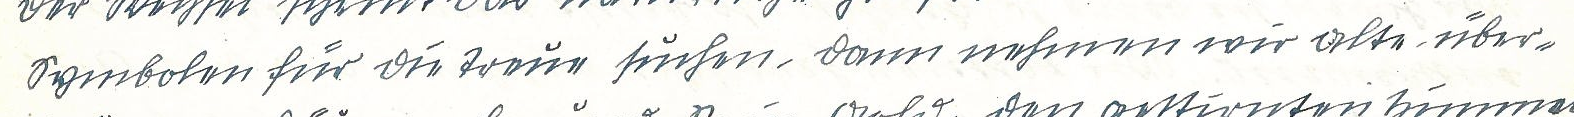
Symbolen für die Treue suchen, dann nehmen wir alte, über¬
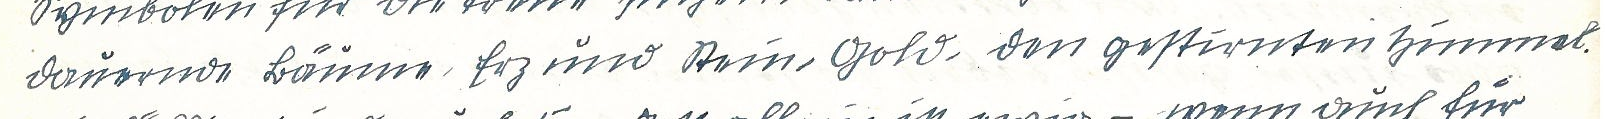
dauernde Bäume, Erz und Stein, Gold, den gestirnten Himmel.
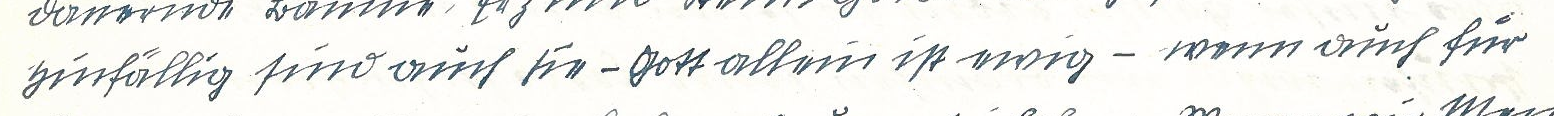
Hinfällig sind auch sie – Gott allein ist ewig – wenn auch für
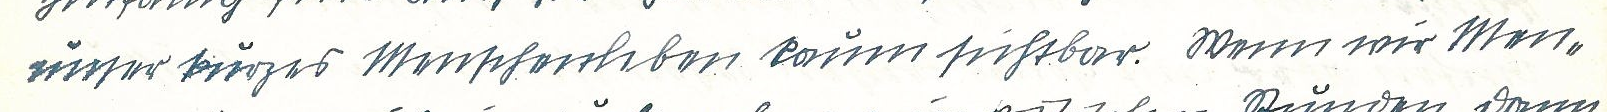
unser kurzes Menschenleben kaum sichtbar. Wenn wir Men¬
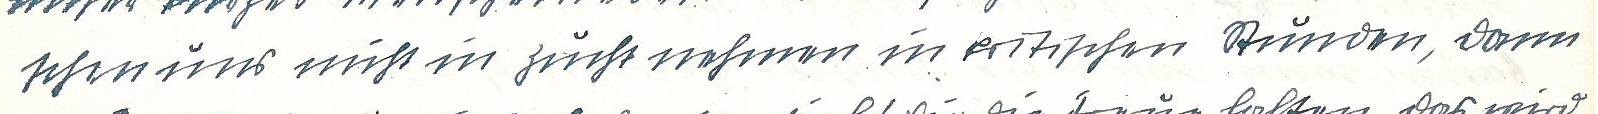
schen uns nicht in Zucht nehmen in kritischen Stunden, dann
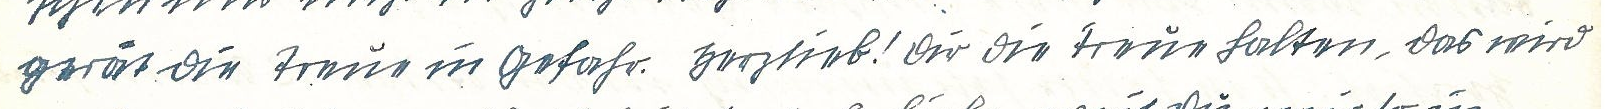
gerät die Treue in Gefahr. Herzlieb! Dir die Treue halten, das wird
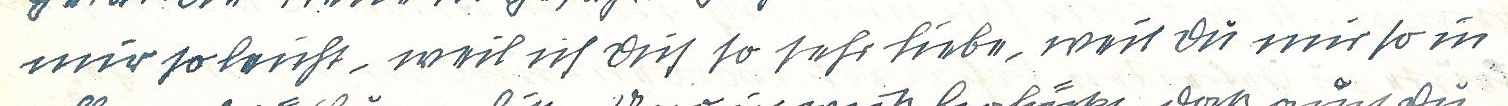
mir so leicht, weil ich Dich so sehr liebe, weil Du mir so in
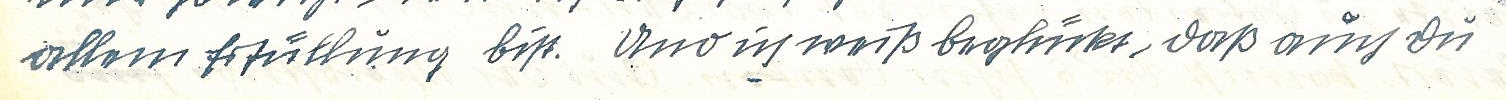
allem Erfüllung bist. Und ich weiß beglückt, daß auch Du
